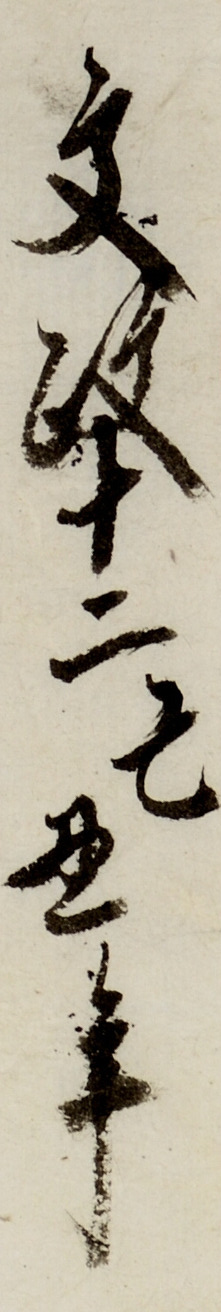文政十二己丑年
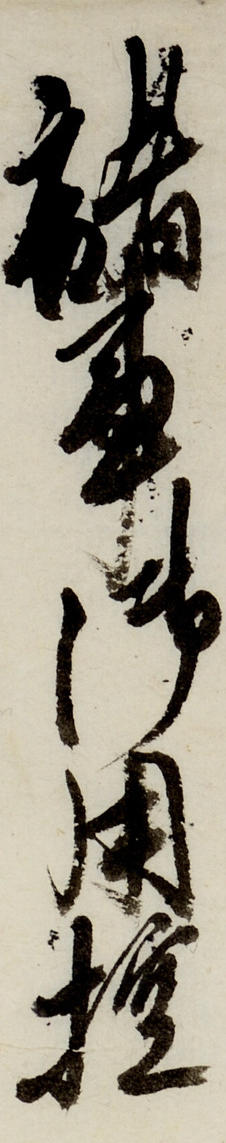諸事御用控
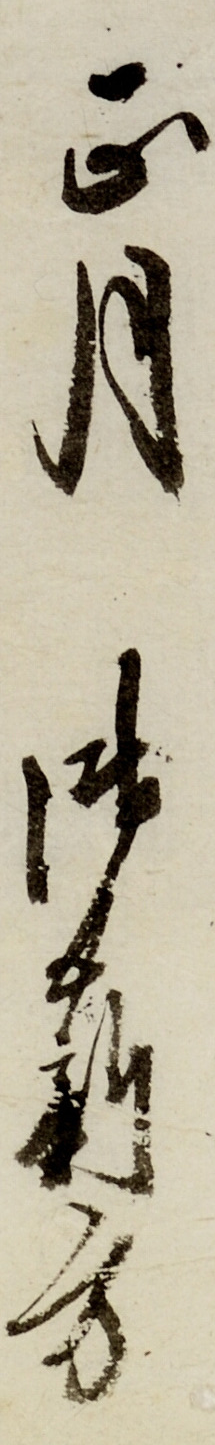正月御薪方
